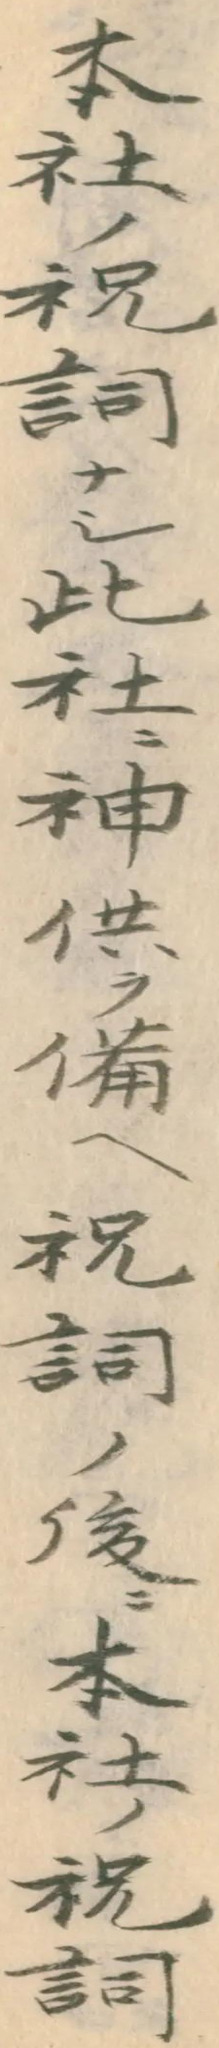本社ノ祝詞ナシ此社ニ神供ヲ備ヘ祝詞ノ後ニ本社之祝詞
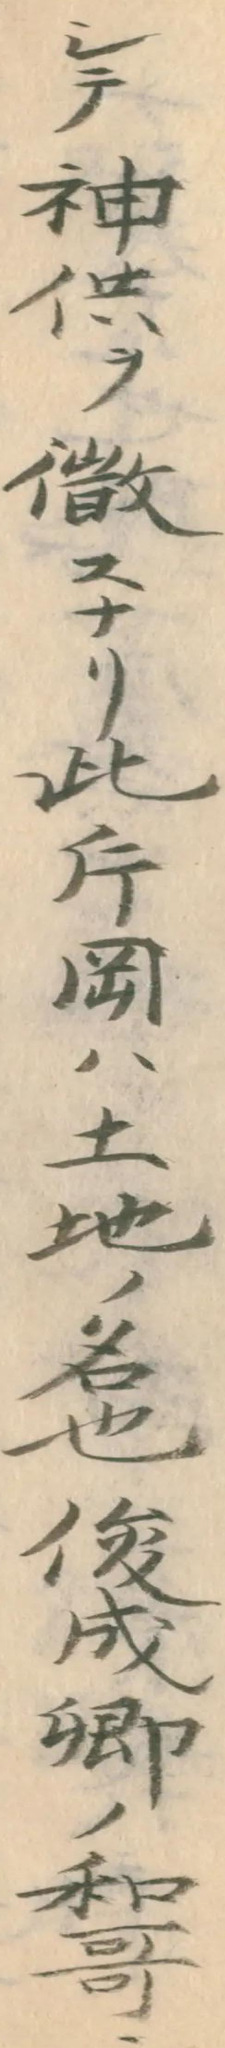シテ神供ヲ徹スナリ此片岡ハ土地ノ名也俊成卿ノ和歌ニ
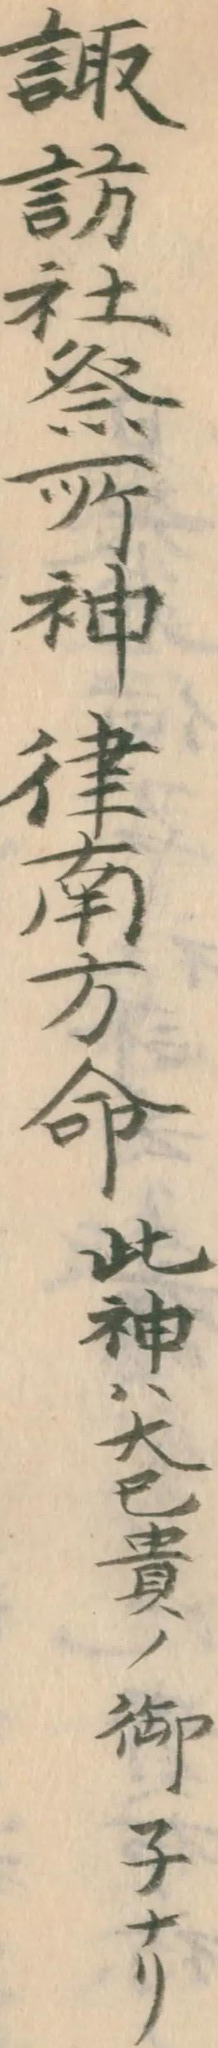諏訪社祭所神律南方命此神は大巳貴の御子ナリ
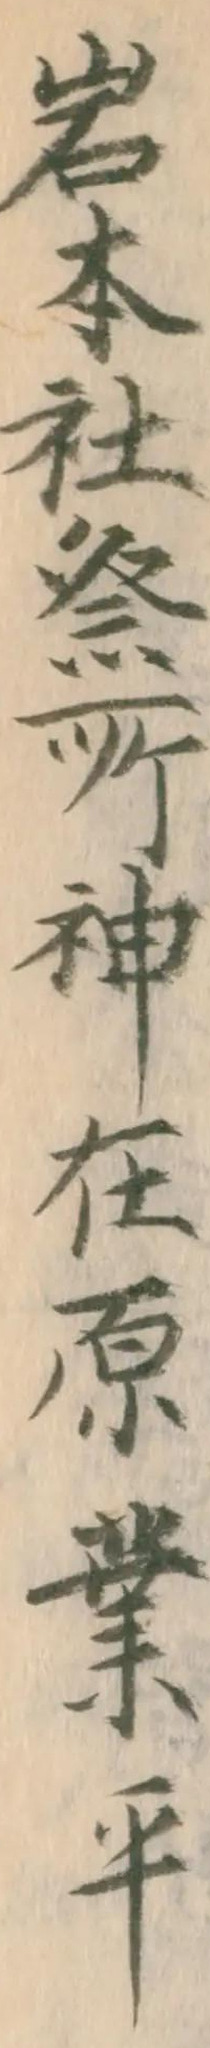岩本社祭所神在原業平
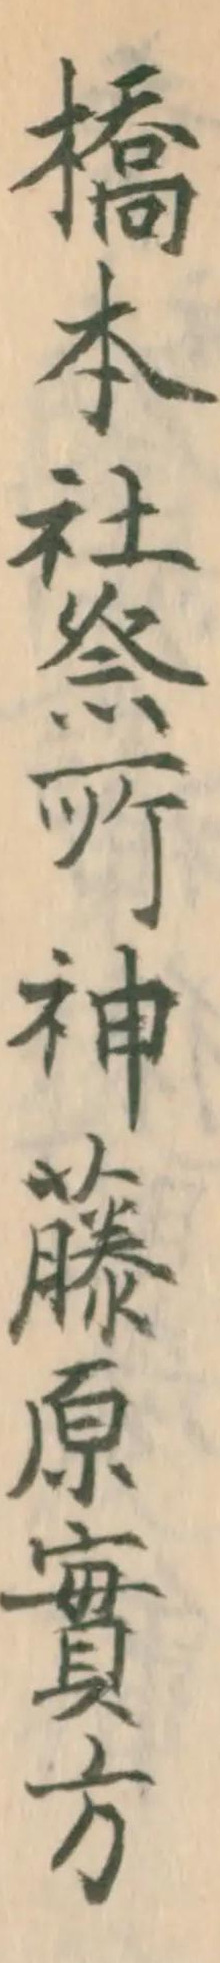橋本社祭所神藤原実方
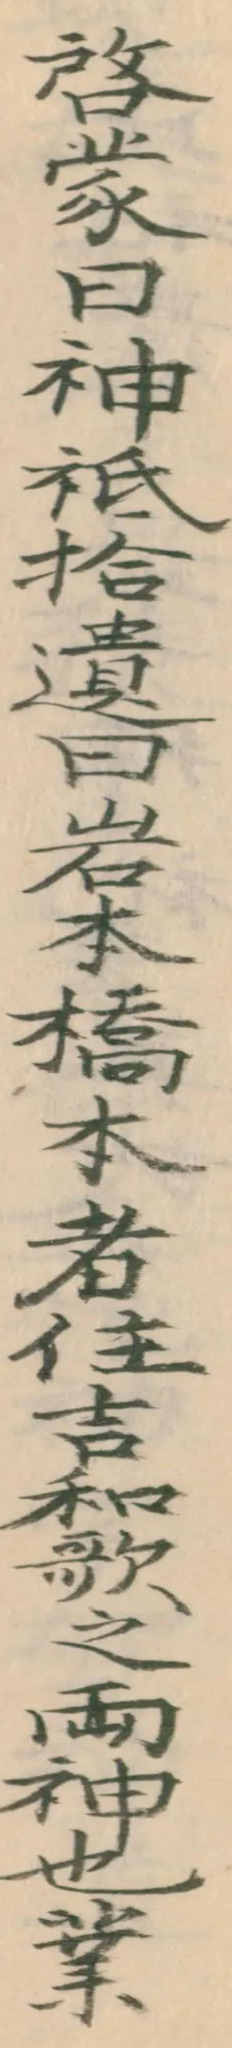啓蒙曰神祇拾遺曰岩本橋本者住吉和歌之両神也業
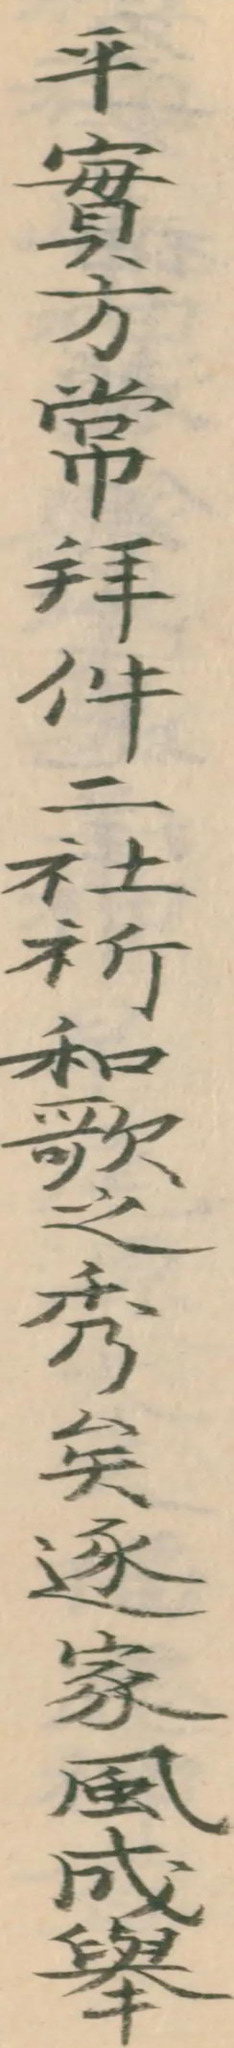平実方常拝件二社祈和歌之秀矣逐家風成挙
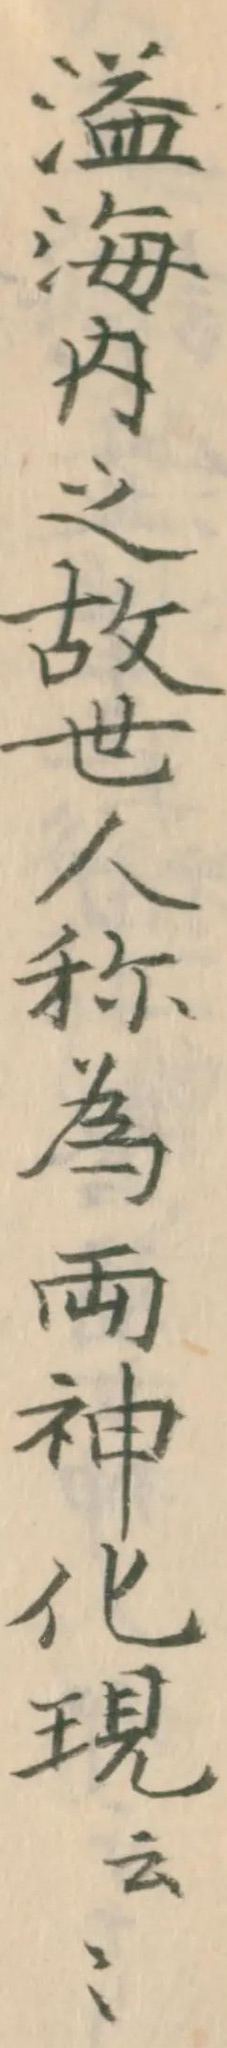溢海内之故世人称為両神化現云々
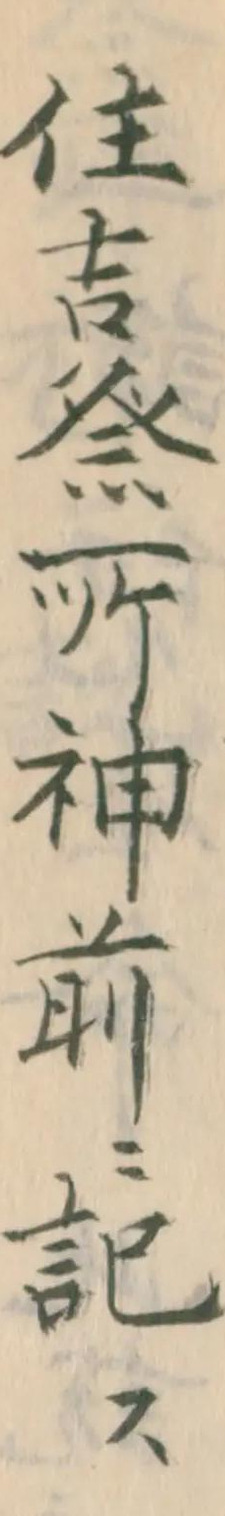住吉祭所神前ニ記ス
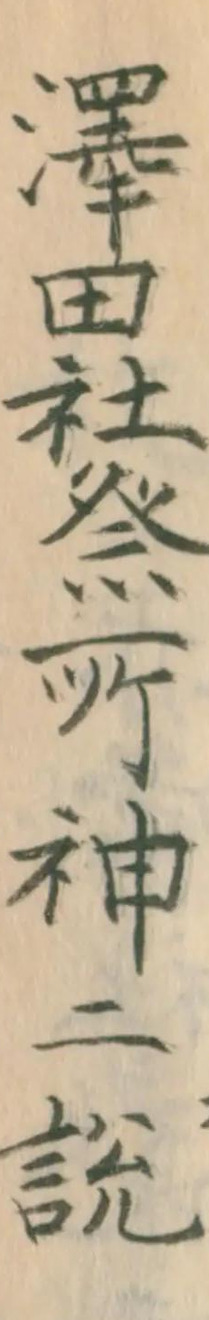沢田社祭所神二説
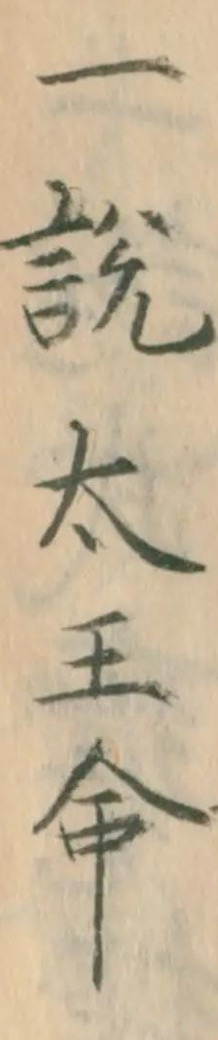一説太王命

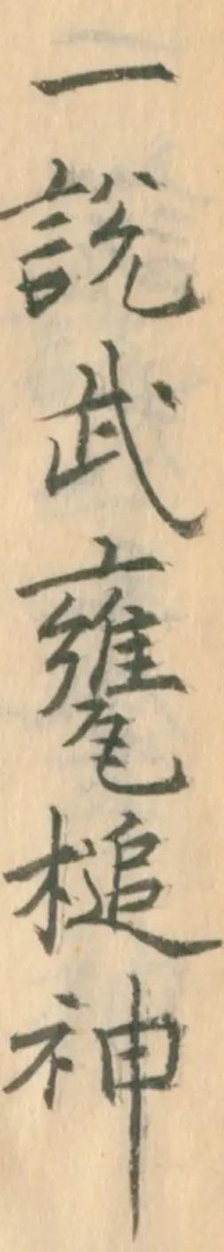一説武甕槌神
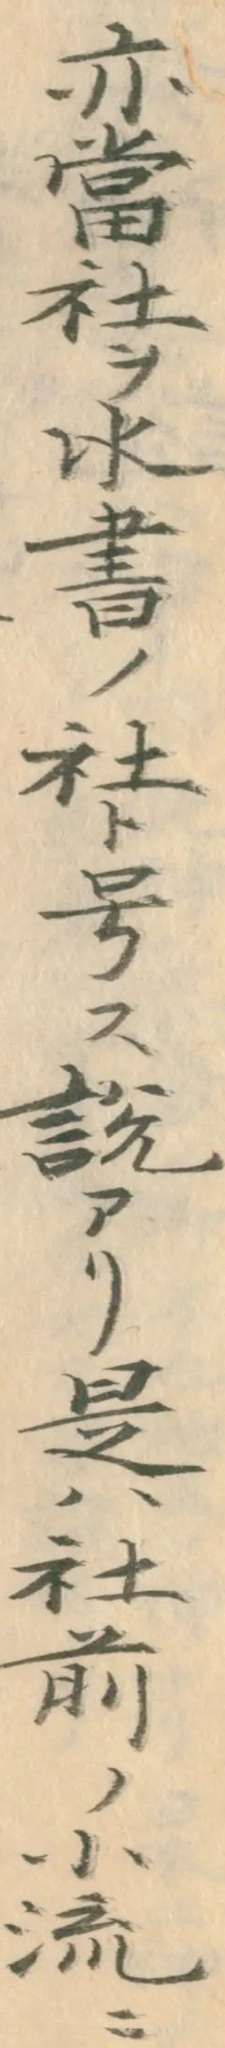亦当社ヲ水書ノ社ト号ス説アリ是ハ社前ノ小流ニ
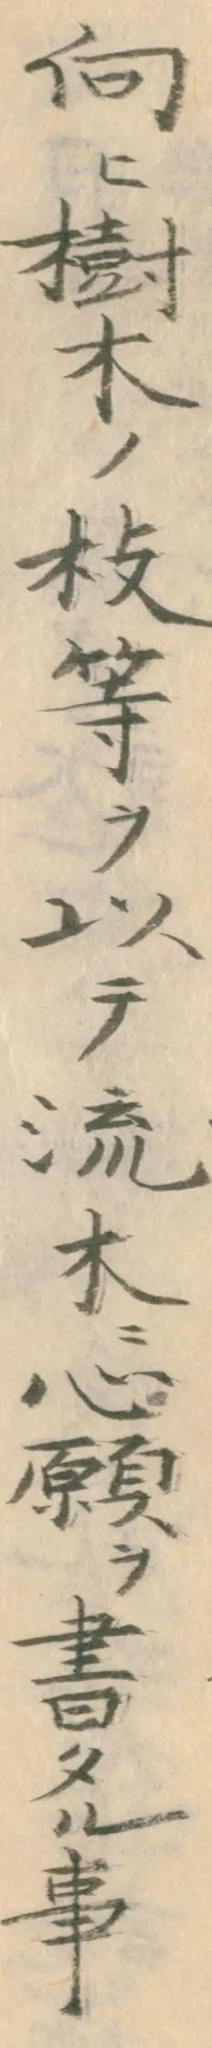向ヒ樹木ノ枝等ヲ以テ流木ニ心願ヲ書タル事
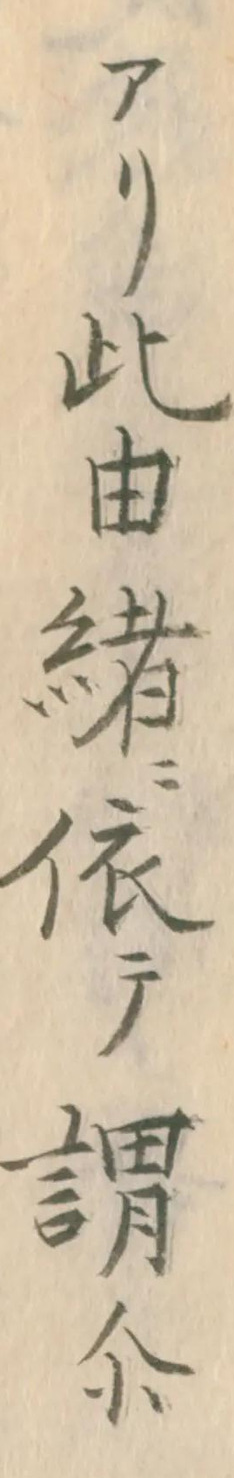アリ此由緒ニ依テ謂尒
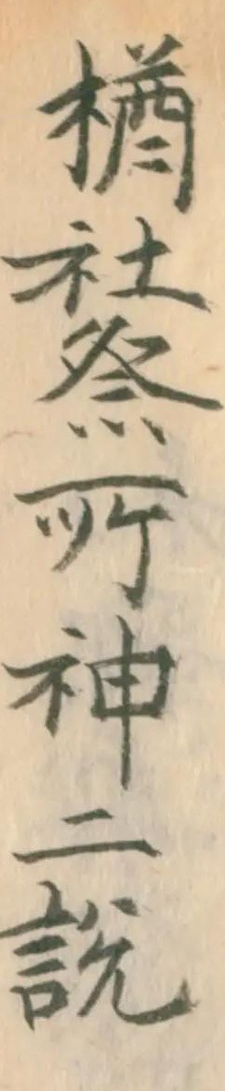楢社祭所神二説
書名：賀茂社記録. 第91冊
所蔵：国立国会図書館 National Diet Library, JAPAN
